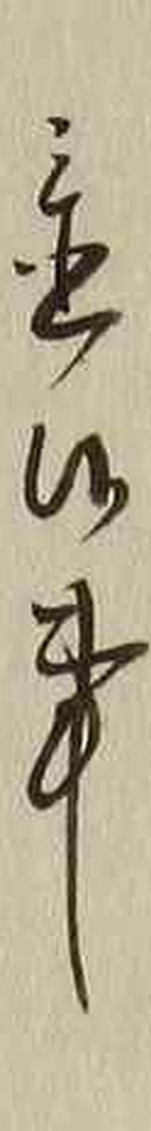置候事
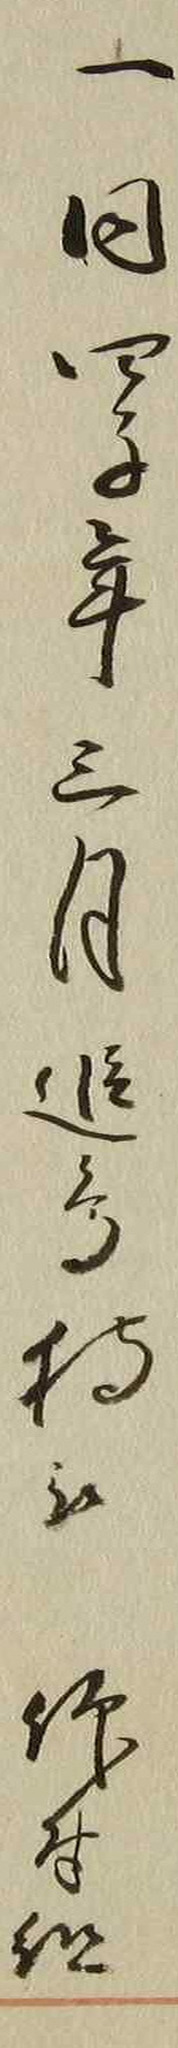一同四子年三月追鳥狩被仰付組
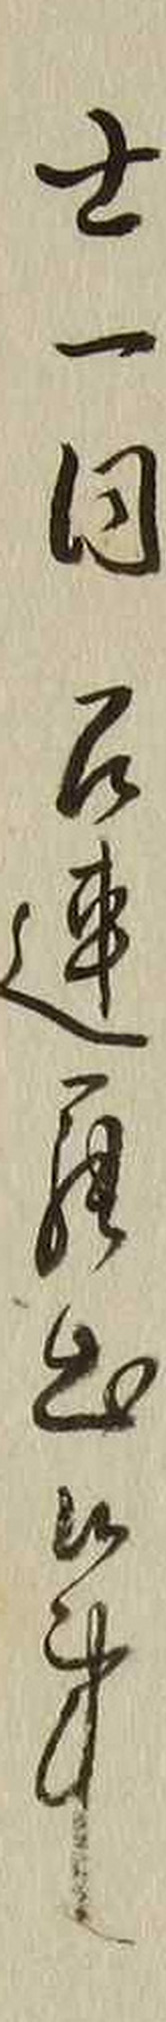士一同召連罷出候事
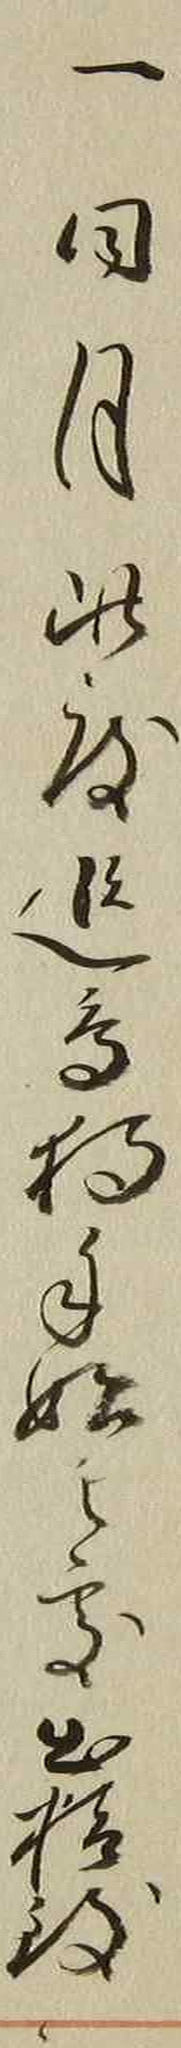一同月此度追鳥狩手始之処出精致
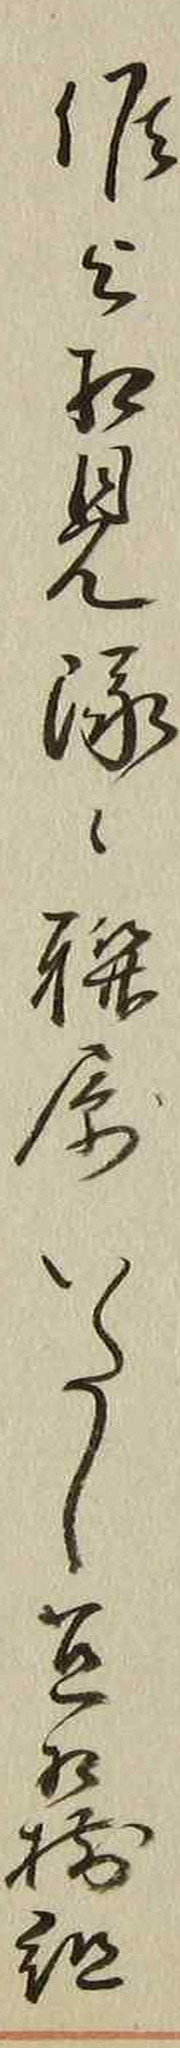候与相見隊々聯属いたし宜相揃組
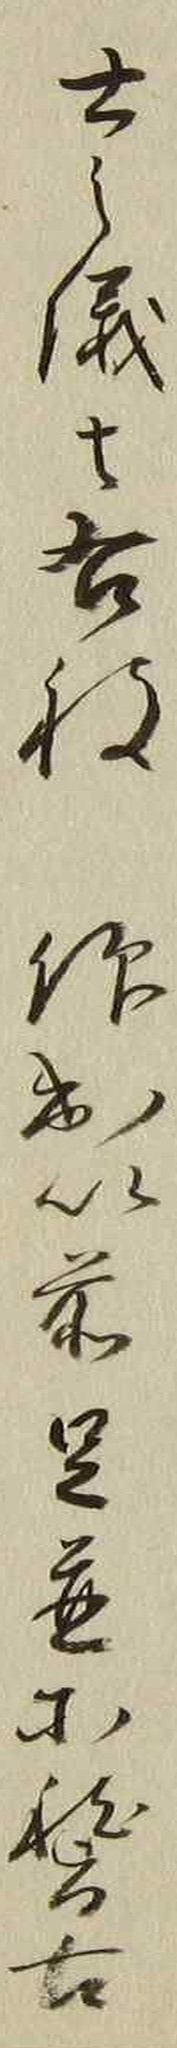士之儀者右被仰出以前足並等稽古
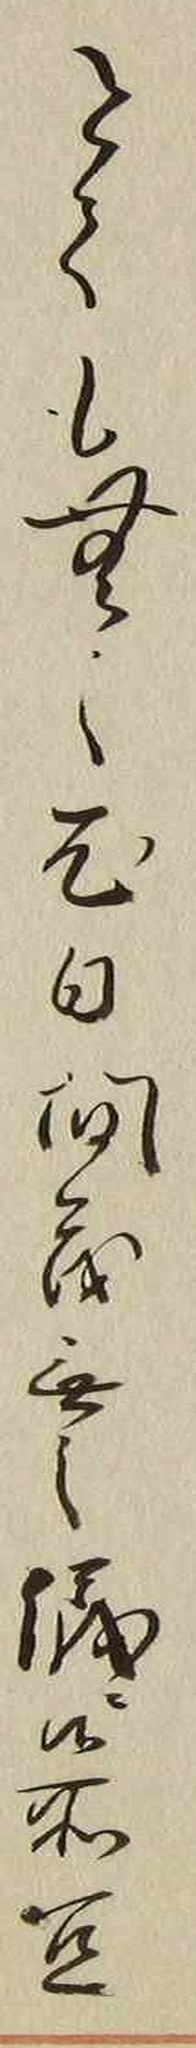とても無之尤日間も無之儀ニ候所宜
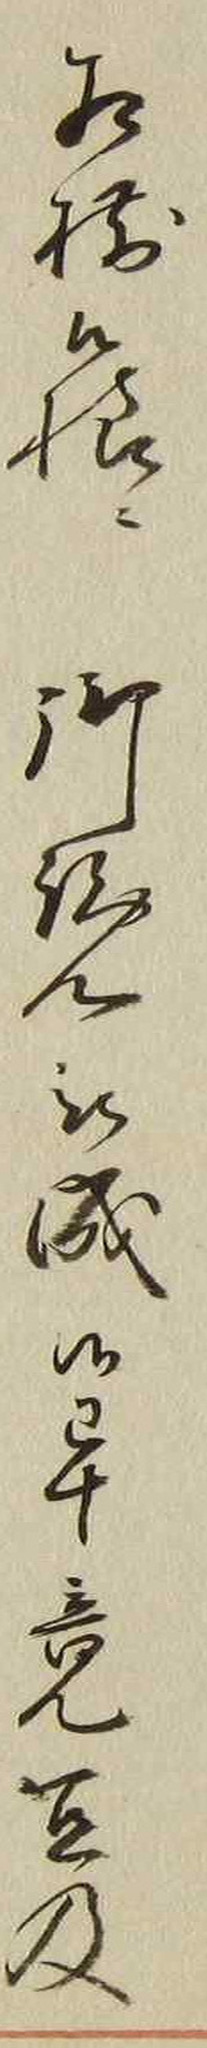相揃候様ニ御覧被成畢竟宜及
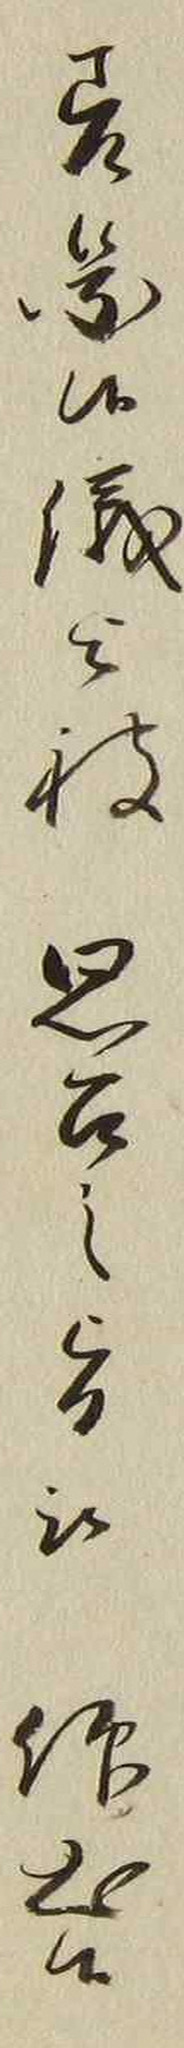差図候儀と被思召之旨被仰出候
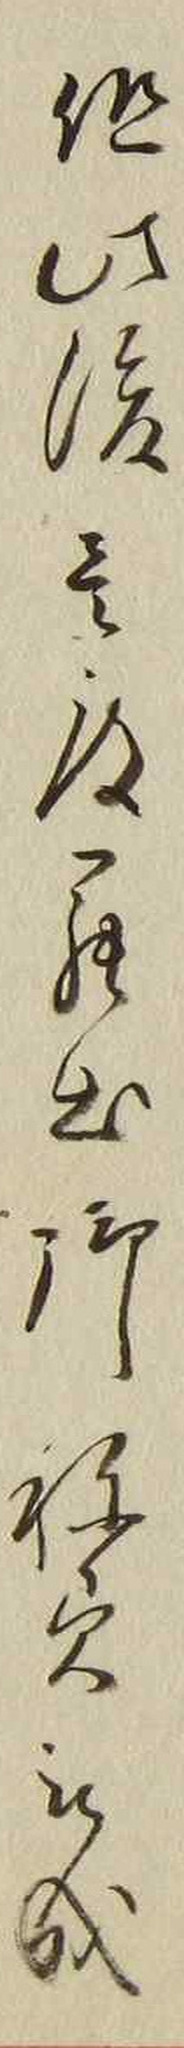但此後壱度罷出御称美被成
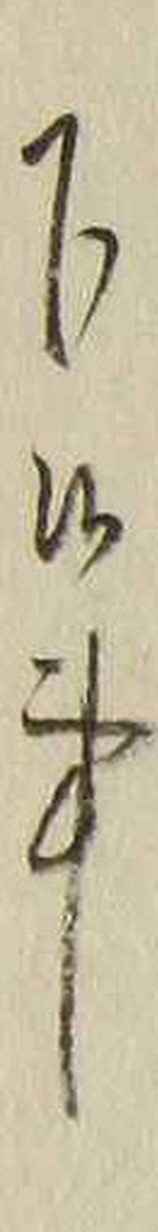下候事

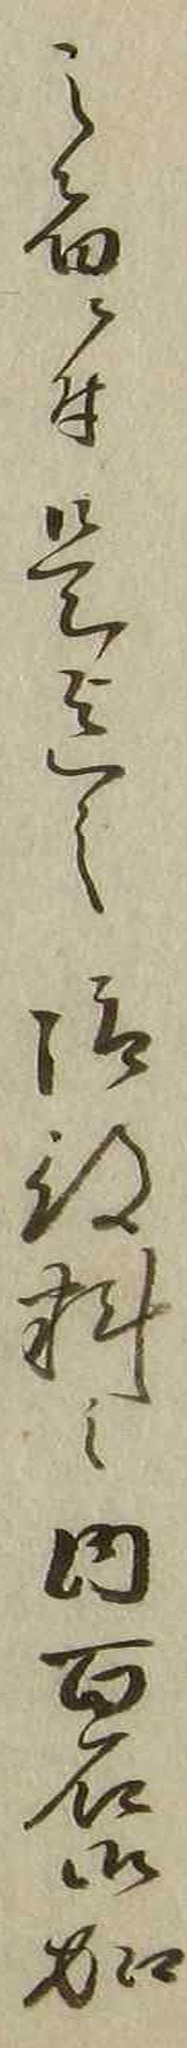之者ニ付是迄之御役料之内百石御加
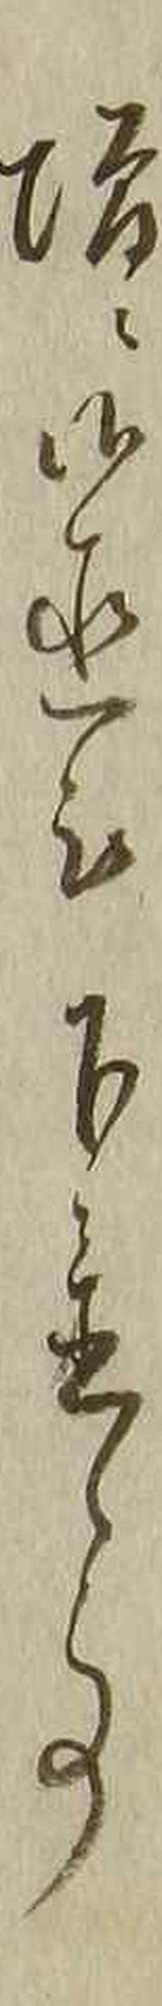増ニ御直被下置候事
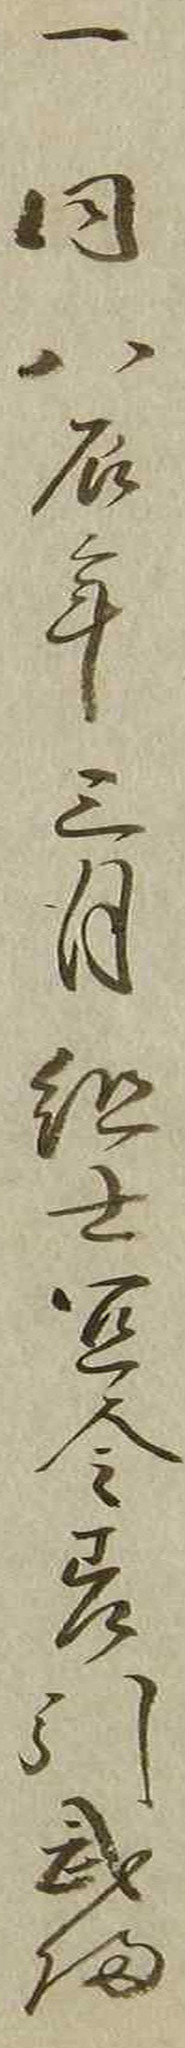一同八辰年三月組士宜令差引武備
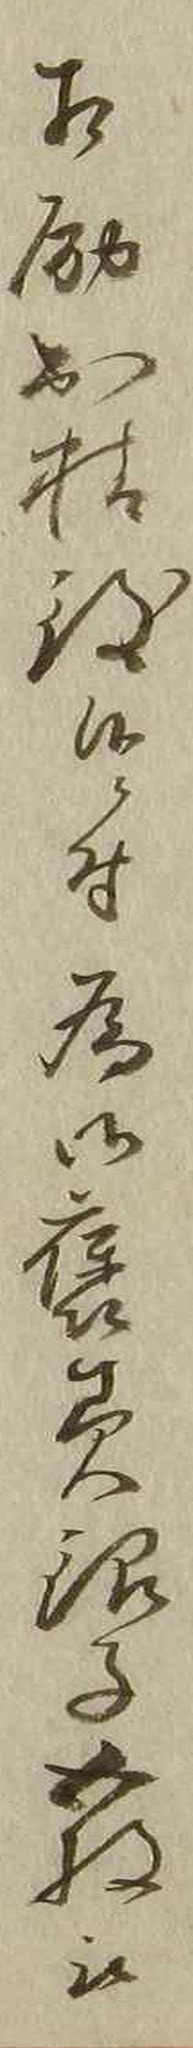相励出精致候ニ付為御褒美銀子五枚被
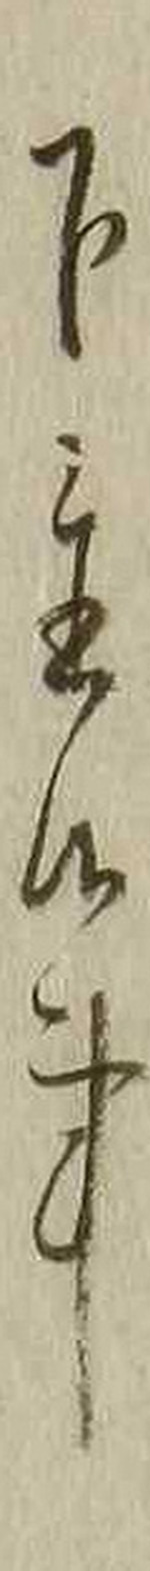下置候事
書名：諸士系譜　巻之122　よ之部5
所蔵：会津若松市立会津図書館
